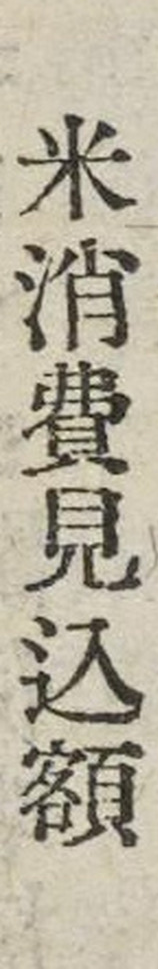米供給見込額
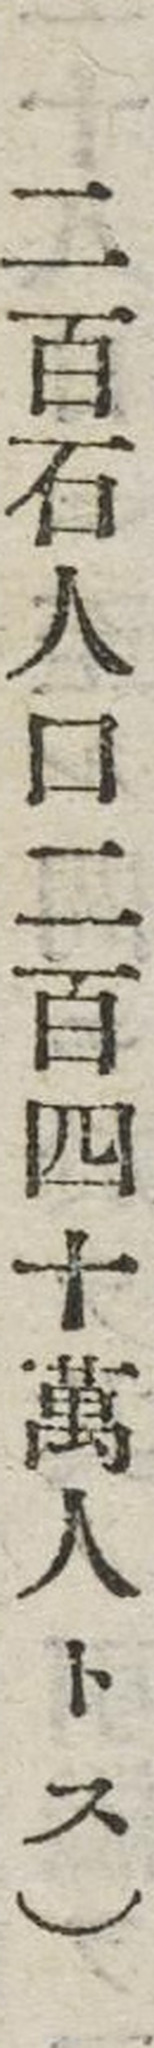六百石人口ハ二百二十万人トス）
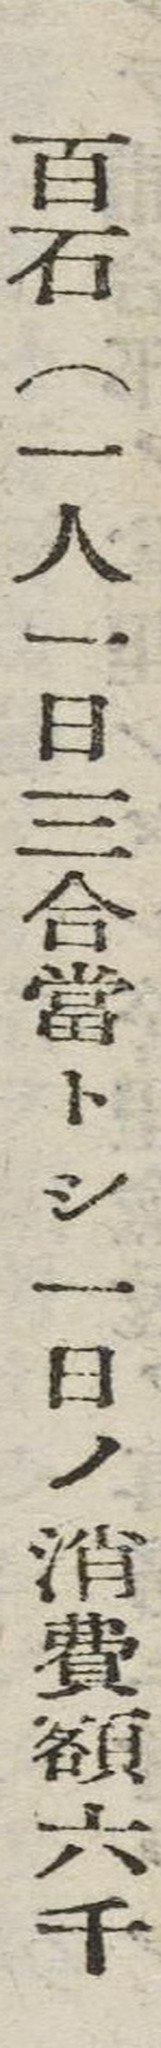百石（一人一日三合当トシ一日ノ消費額六千
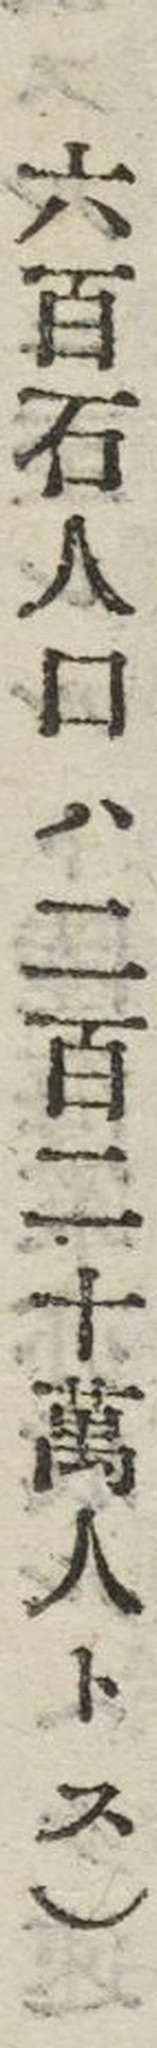六百石人口ハ二百二十万人トス）
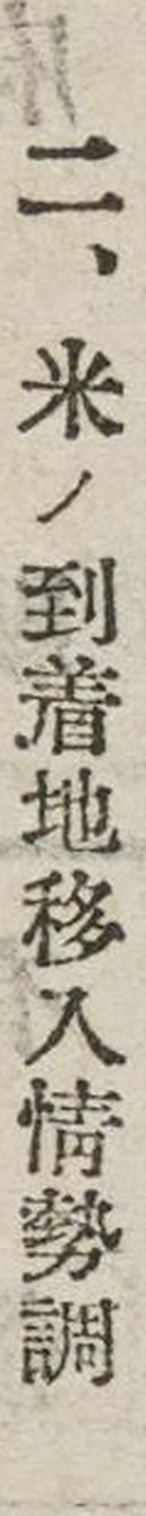ニ、米ノ到着地移入情勢調

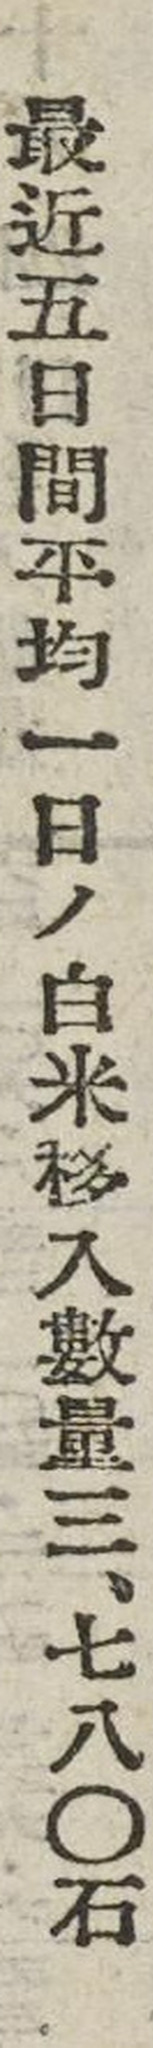最近五日間平均一日ノ白米移入数量三、七八〇石
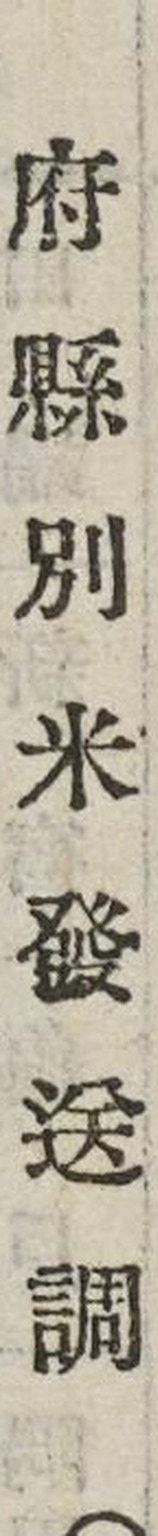府県別米発送調
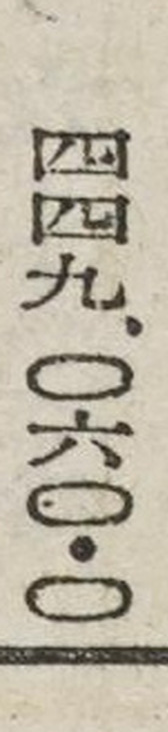計四四九、〇六〇・〇
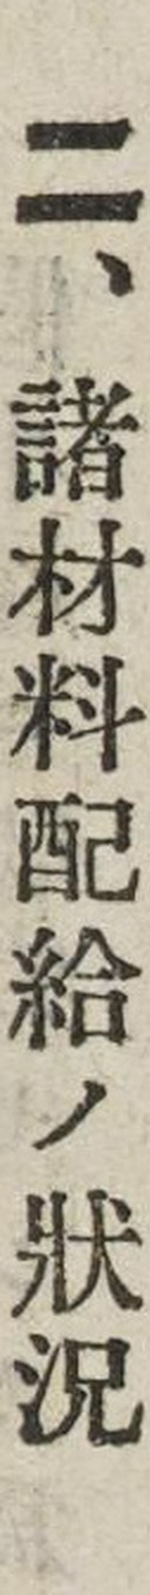ニ、諸材料配給ノ状況
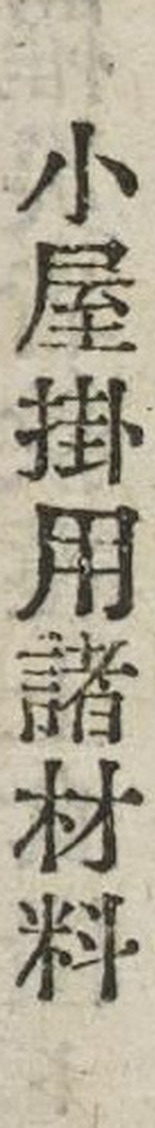小屋掛用諸材料

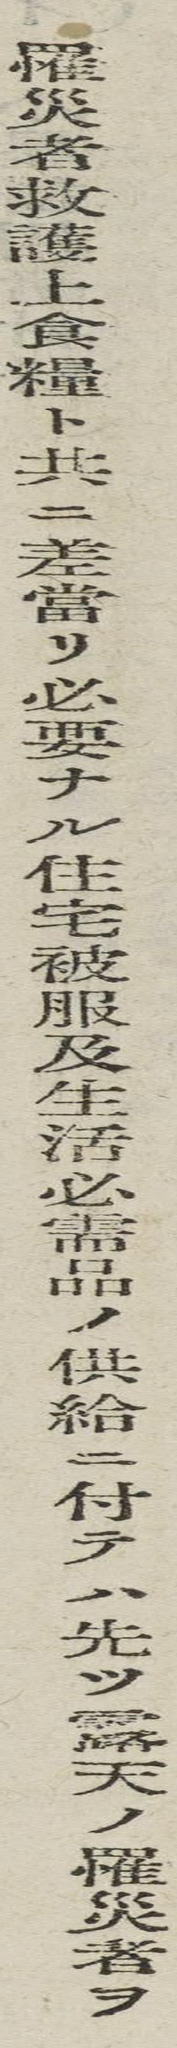罹災者救護上食糧ト共ニ差当リ必要ナル住宅被服及生活必需品ノ供給ニ付テハ先ツ露天ノ罹災者ヲ
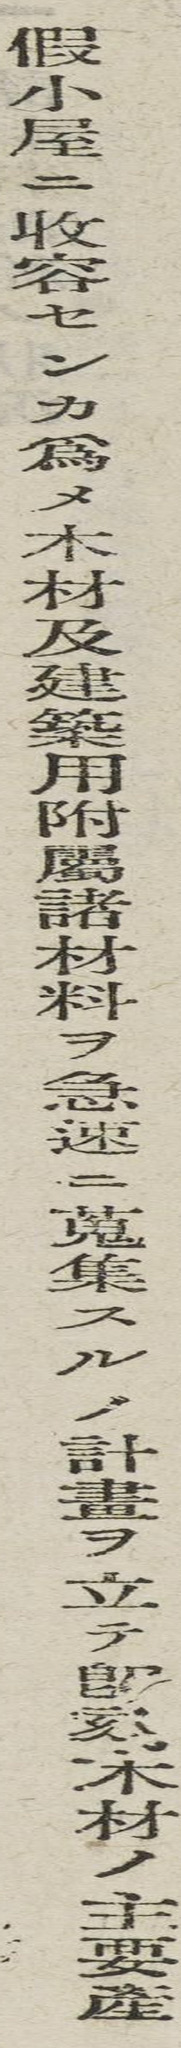仮小屋ニ収容センカ為メ木材及建築用付属諸材料ヲ急速ニ蒐集スルノ計画ヲ立テ即刻木材ノ主要産
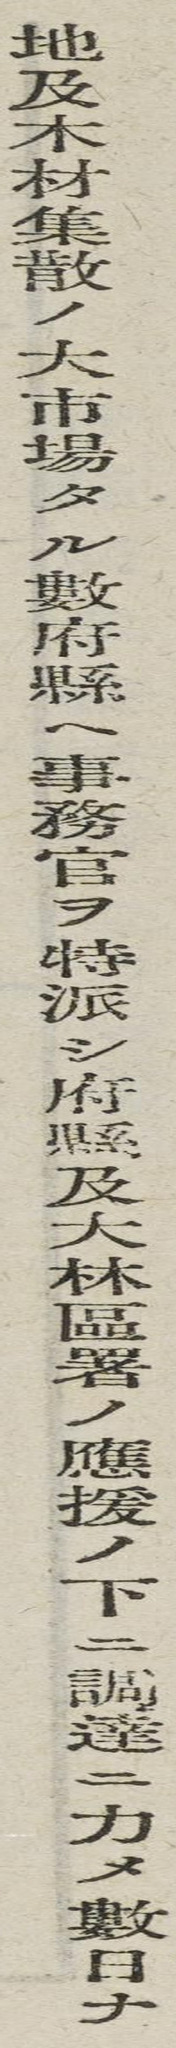地及木材集散ノ大市場タル数府県ヘ事務官ヲ特派シ府県及大林区署ノ応援ノ下ニ調達ニ力メ数日ナ
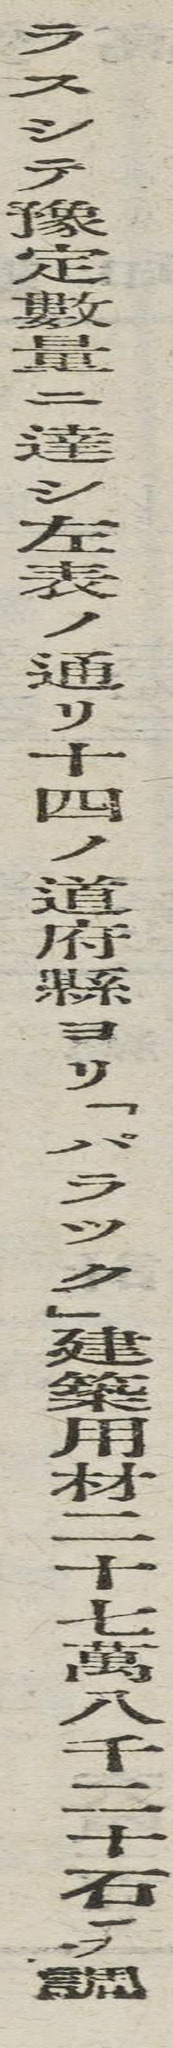ラスシテ予定数量ニ達シ左表ノ通リ十四ノ道府県ヨリ「バラツク」建築用材二十七万八千二十石ヲ調
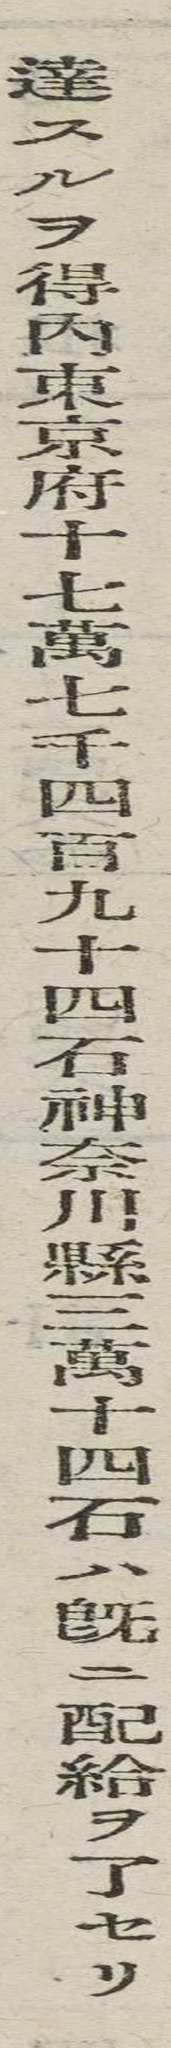達スルヲ得内東京府十七万七千四百九十四石神奈川県三万十四石ハ既ニ配給ヲ了セリ
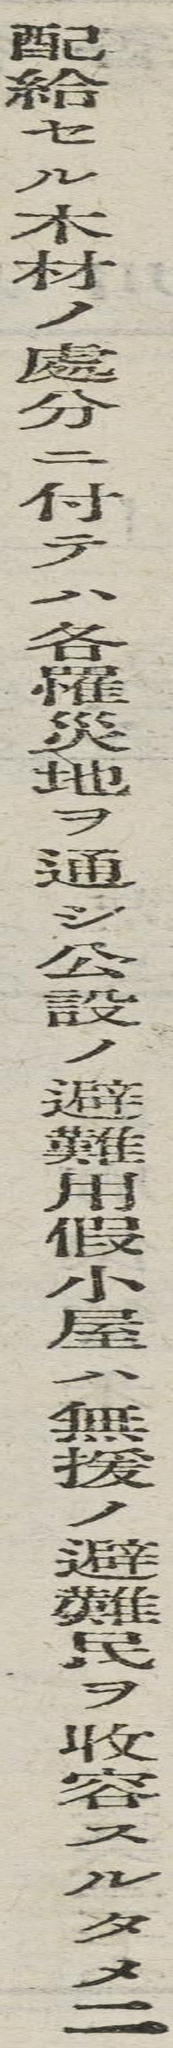配給セル木材ノ処分ニ付テハ各罹災地ヲ通シ公設ノ避難用仮小屋ハ無援ノ避難民ヲ収容スルタメ二
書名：震災被害状況並救護施設概要
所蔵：東京大学地震研究所図書室 Earthquake Research Institute Library, The University of Tokyo, JAPAN
